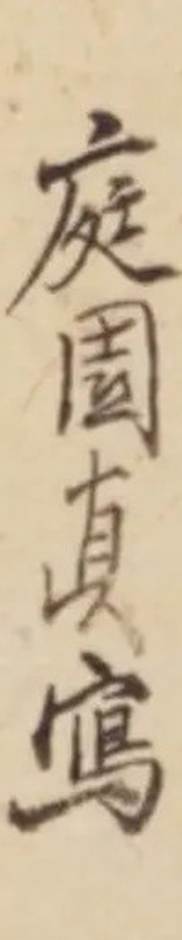庭園真寫
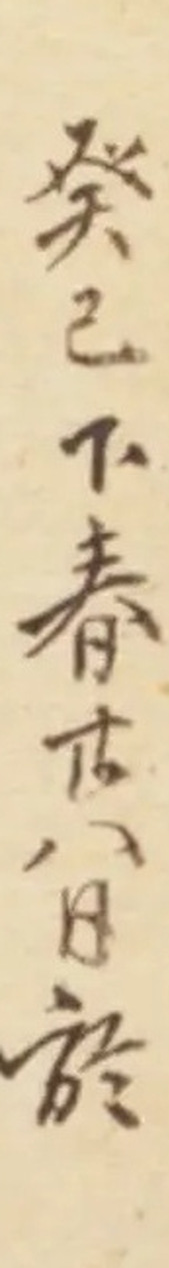癸巳下春廿有八日於
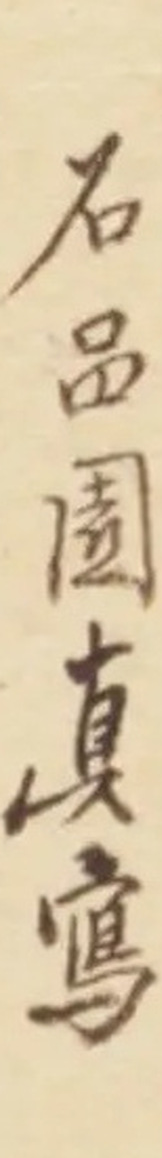石品園真寫
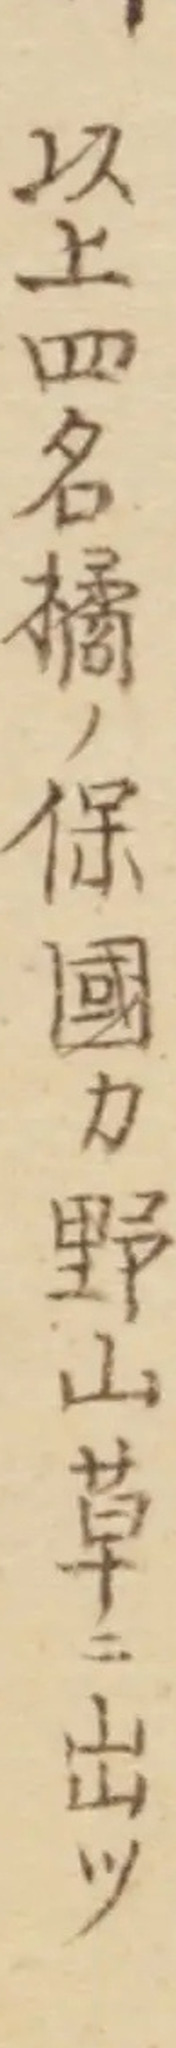以上四名橘の保國か山野草に出つ

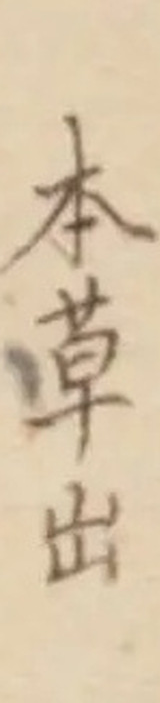本草出
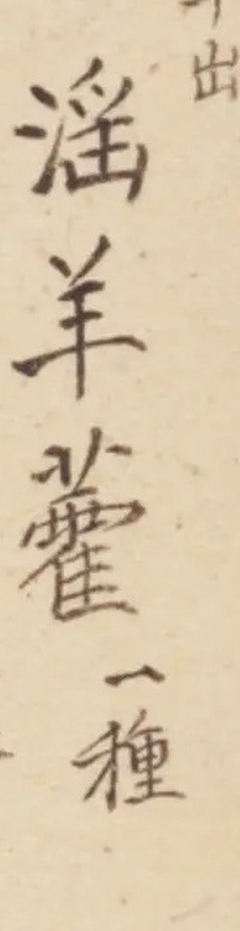淫羊藿一種
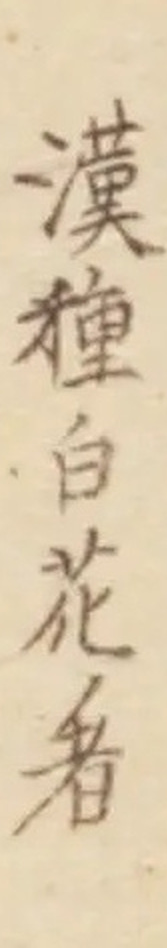漢種白花ノ者
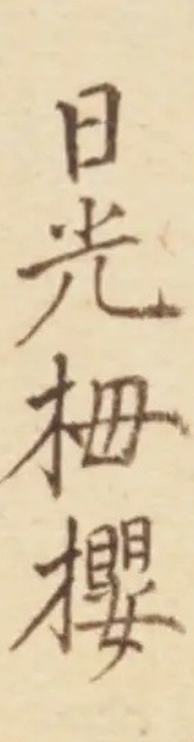日光栂桜
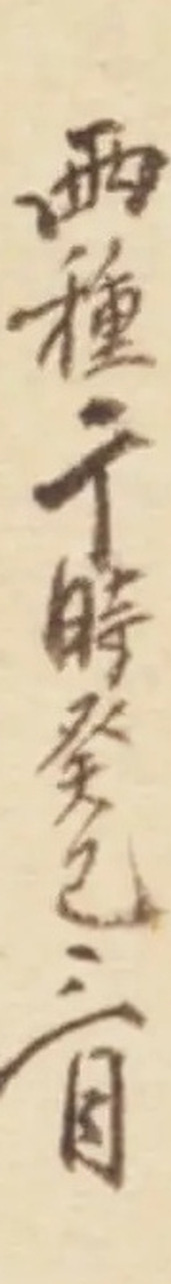両種亍時癸巳三月
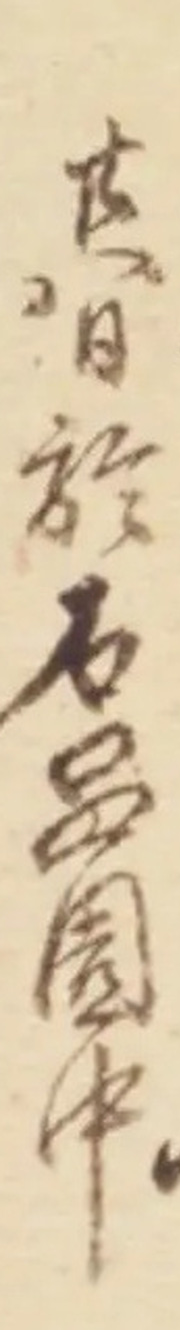廿八日於石品園中

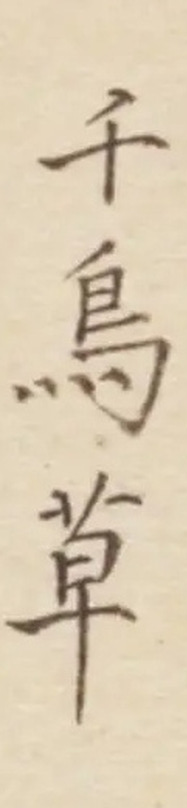千鳥草
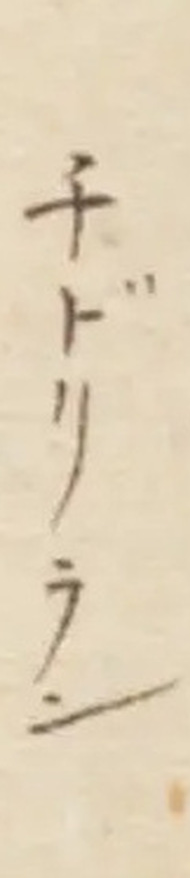チドリラン
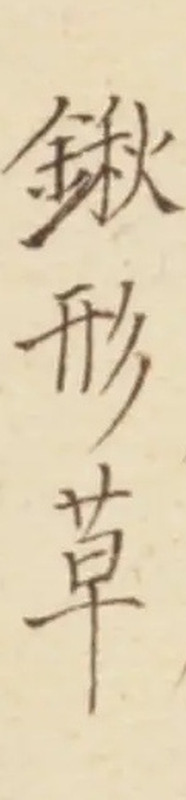鍬形草
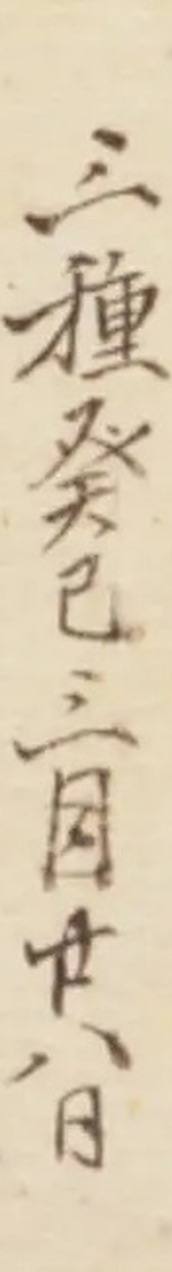三種癸巳三月廿八日
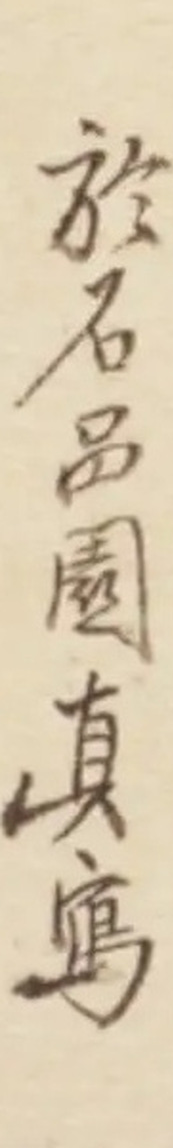於石品園真寫

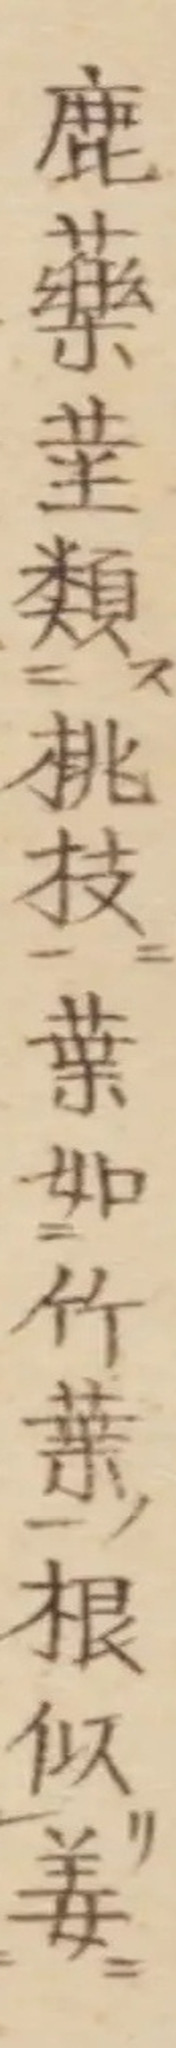鹿藥莖類ス桃枝ニ葉如シ竹葉ノ根似リ姜ニ
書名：梅園草木花譜春之部. 4
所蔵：国立国会図書館 National Diet Library, JAPAN
